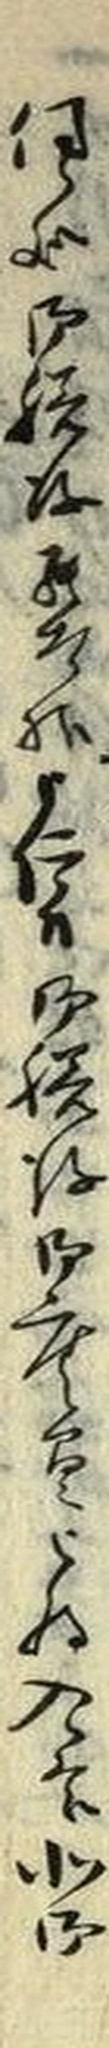伺候処御膳後罷出候様被仰付御膳後御座之間ニ被為入候節北御
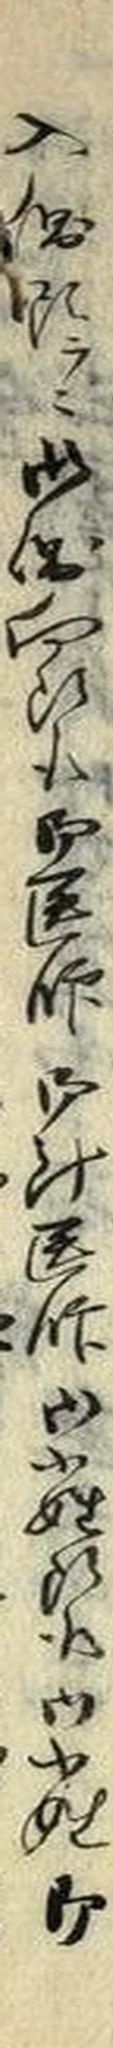入側頭ラニ御側向頭取御医師御針御医師御小姓頭取御小姓御
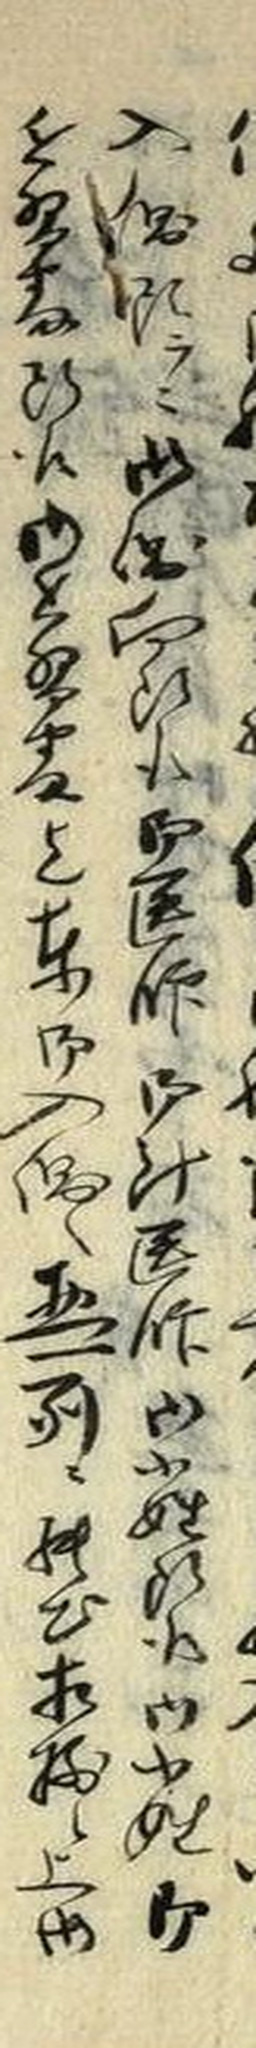近習番頭取御近習番迄東御入側へ惣一列ニ罷出相揃候上御
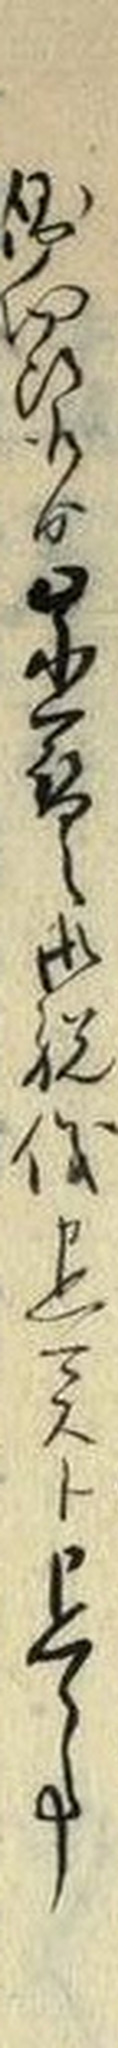側向頭取ゟ歳暮之御祝儀申上マスト申上候事
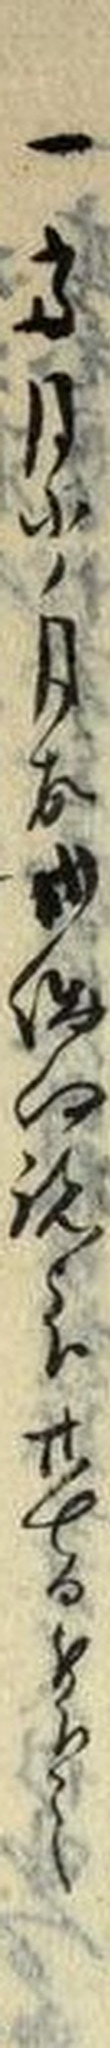一当月小ノ月故御側向諸被下廿七日被下之
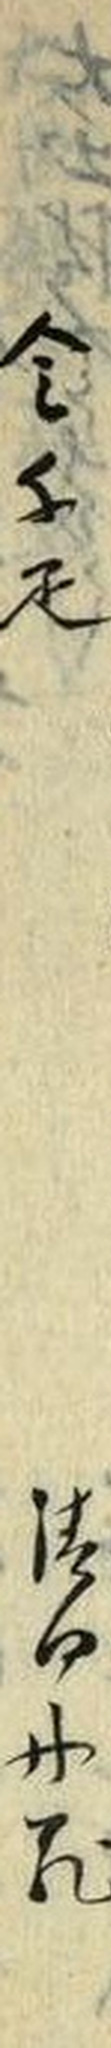金千疋清田丹蔵
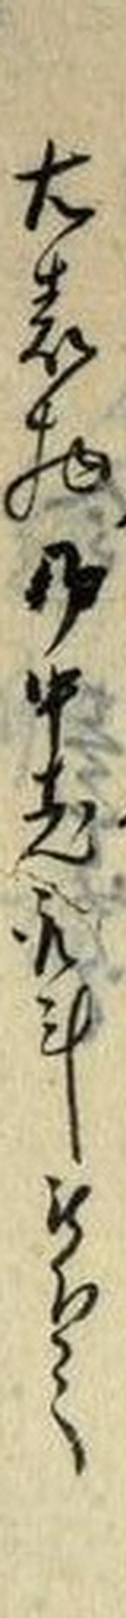右表物御中老取計被下之

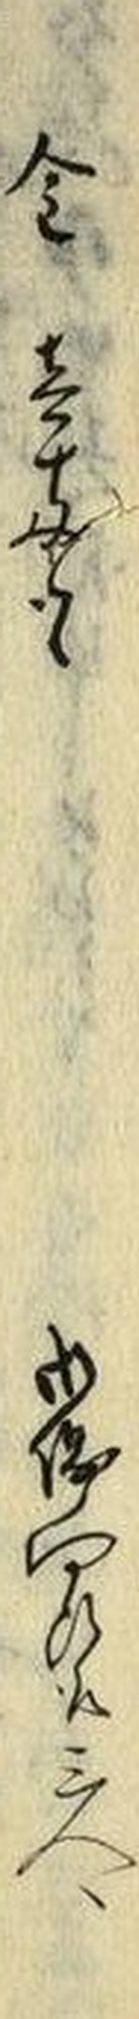金壱両ツヽ御側向頭取三人へ
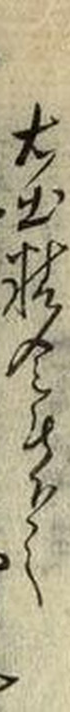右出精金被下之
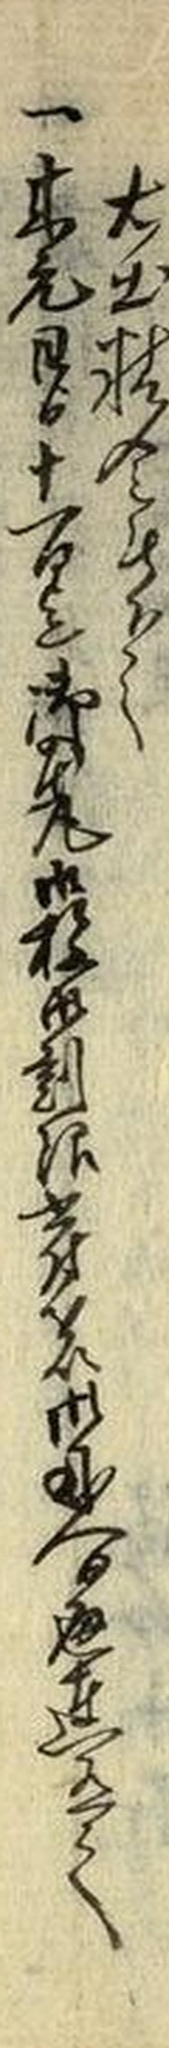一来元日ゟ十一日迄御本丸御移御刻限書付を以御用人ゟ通達有之
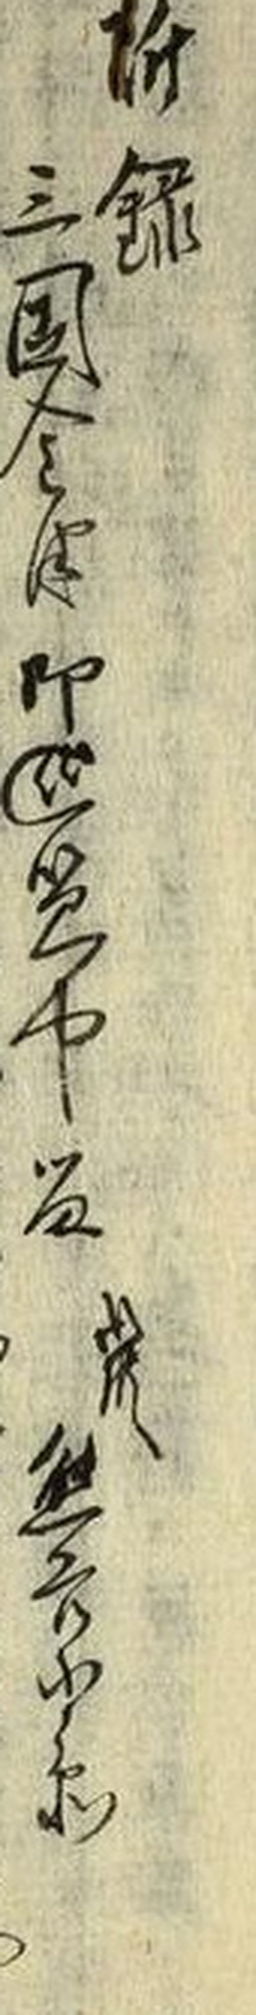三国金津御巡覧中留御供熊谷小兵衛
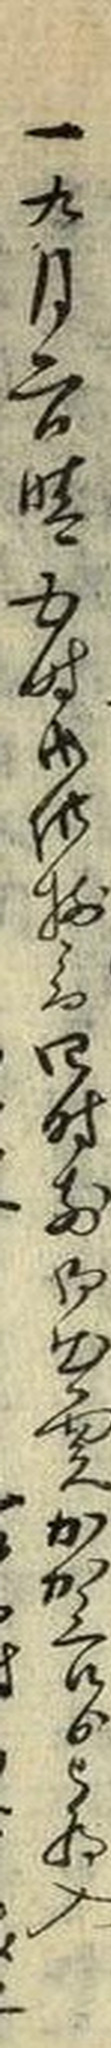一九月二日晴五時御供揃ニ而四時前御出殿加賀口ゟ被為入
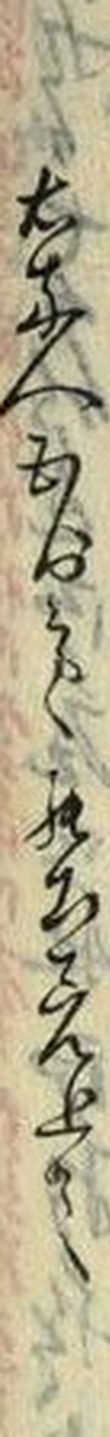右両人五右衛門方へ罷出差上之
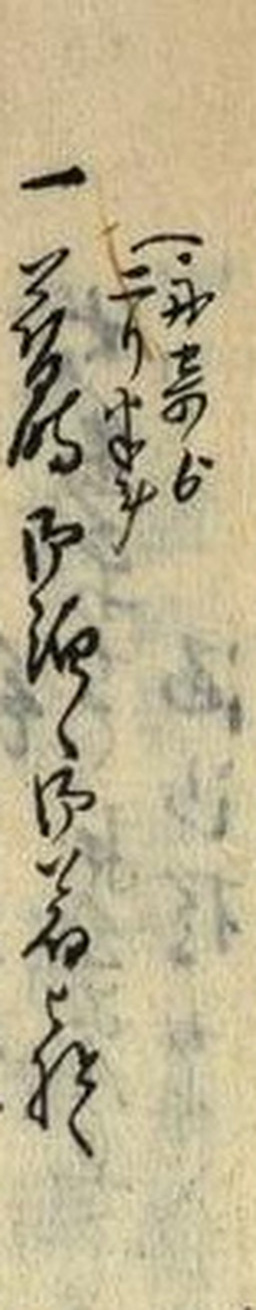一暮時御泊へ御着被遊候
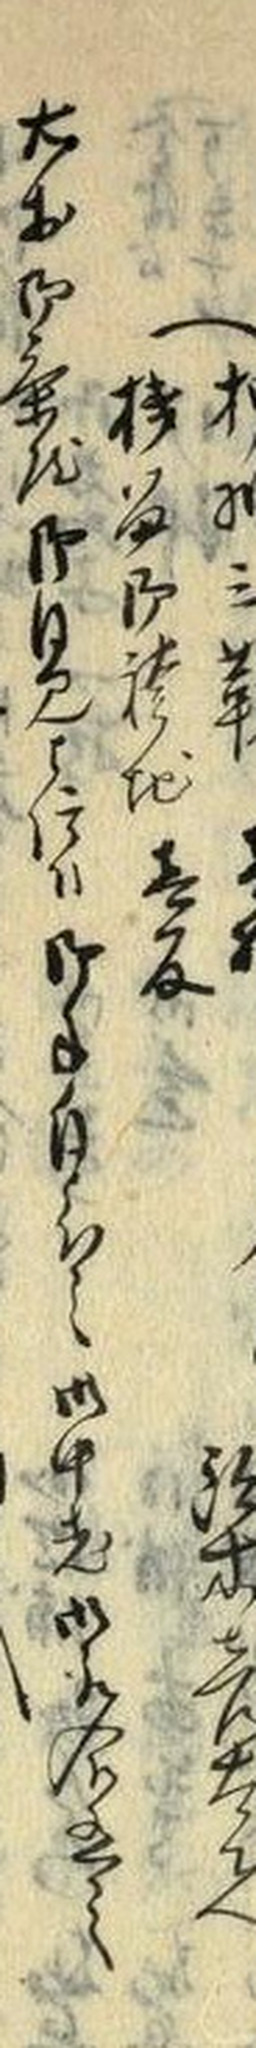右於御茶屋御目見被仰付御手自被下之御中老取合有之
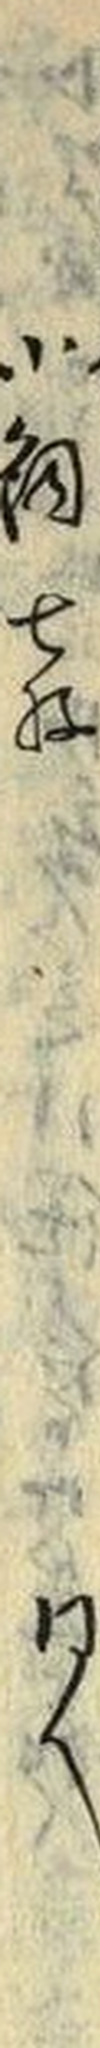小鯛七枚同人
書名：少傅日録抄（斉承付側向頭取日記、在国）
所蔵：福井県文書館 Fukui Prefectural Archives
